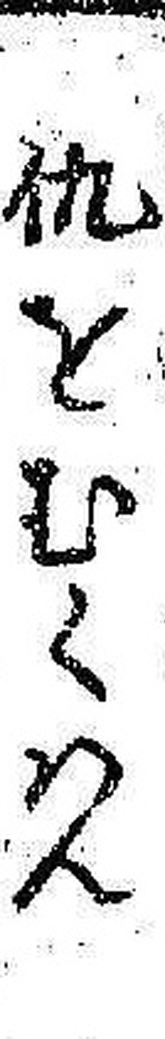仇をむくはん
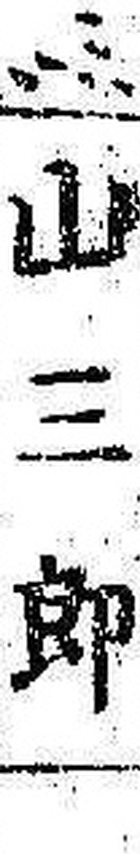山三郎

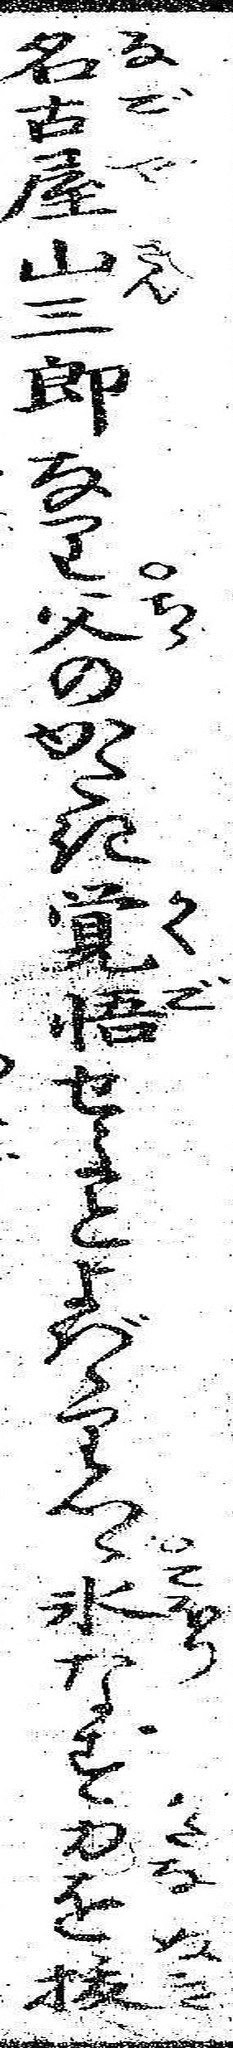名古屋山三郎なり。父のかたき覚悟せよとよばゝりつゝ。氷なす刀を抜
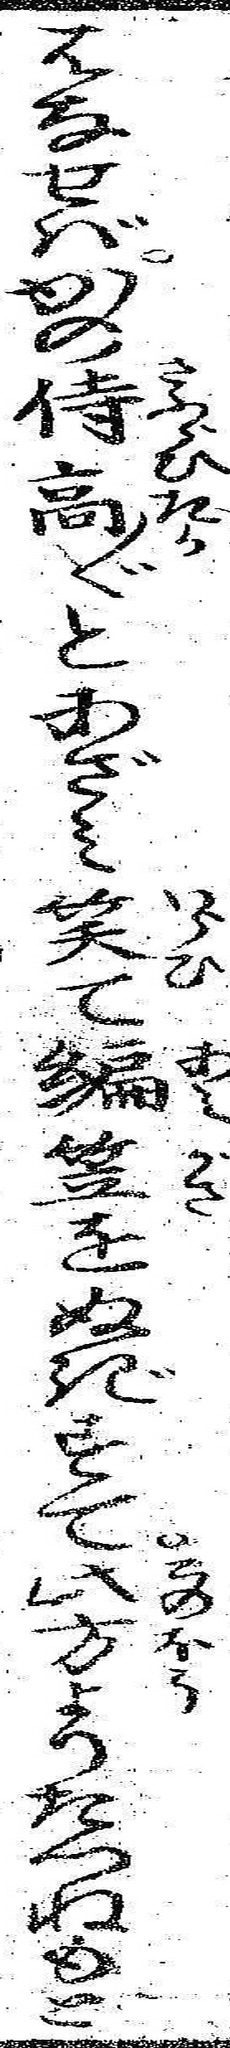はなせば。かの侍高とあざみ笑て編笠をぬぎすて。此方よりたつねもと
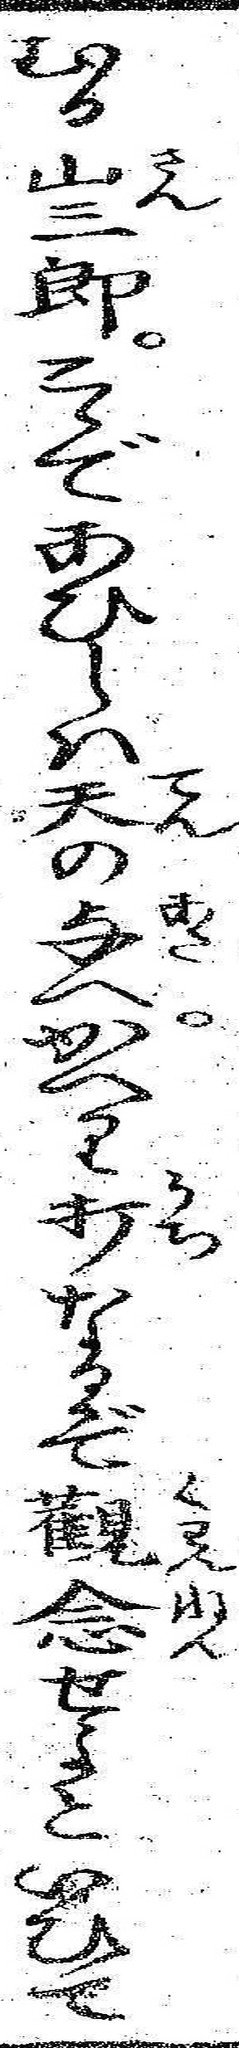むる山三郎。こゝであひしは天の与へ。かへり打なるぞ観念せよといひて
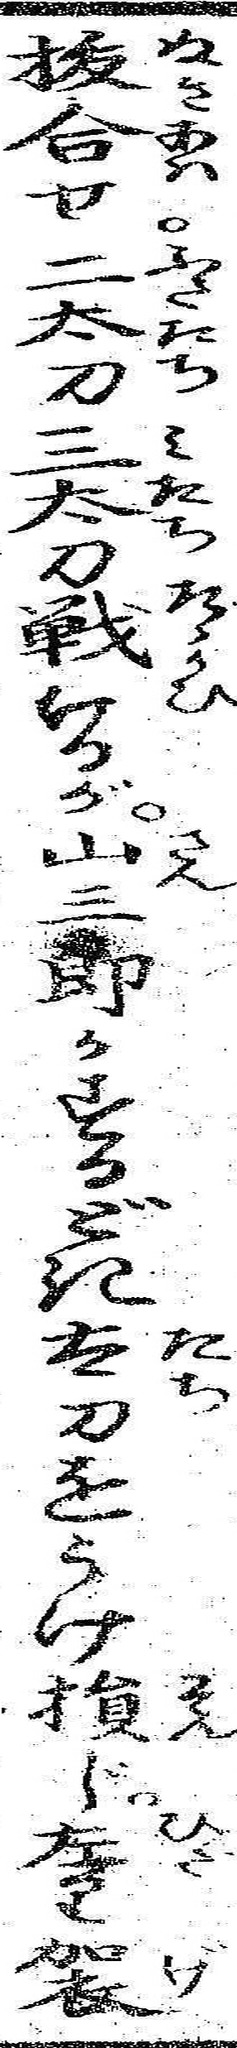抜合せ。二太刀三太刀戦けるが。山三郎かするどき太刀をうけ損じ。左り袈
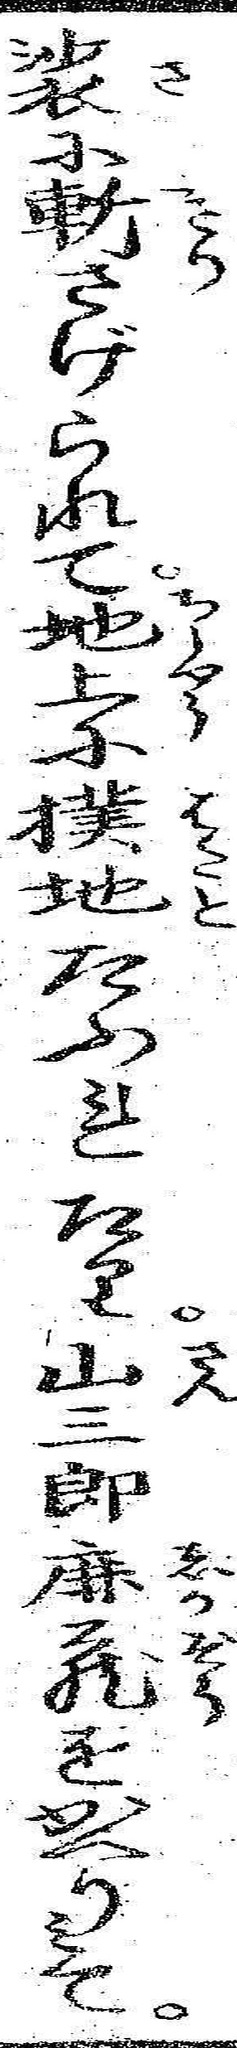裟に斬さげられて。地上に撲地たふれたり。山三郎鹿蔵をかへりみて。
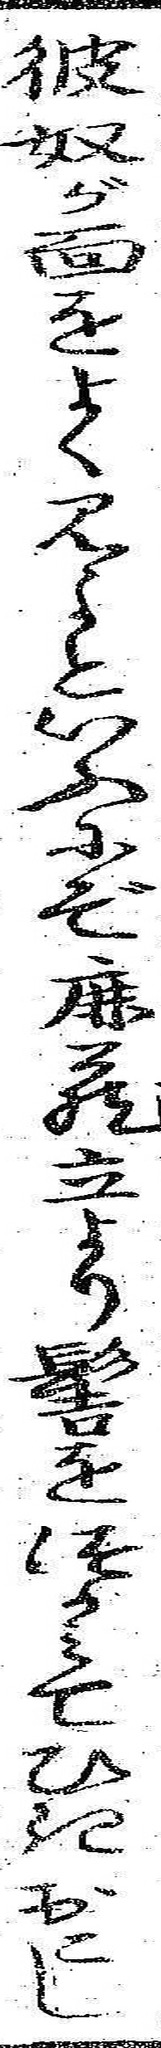彼奴が面をよく見よといふにぞ。鹿蔵立より髻をつかみてひきおこし。
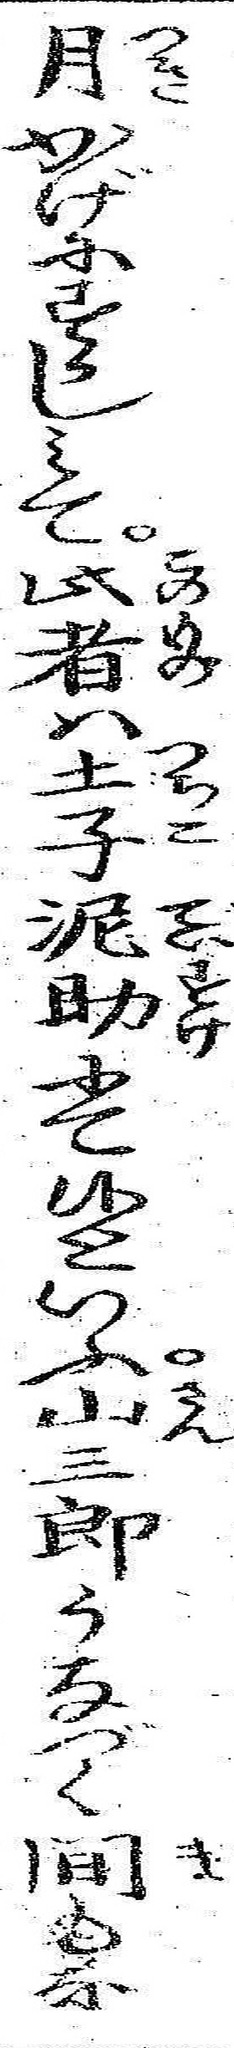月かげにすかしみて。此者は土子泥助にて候といふ。山三郎うなづく間もな
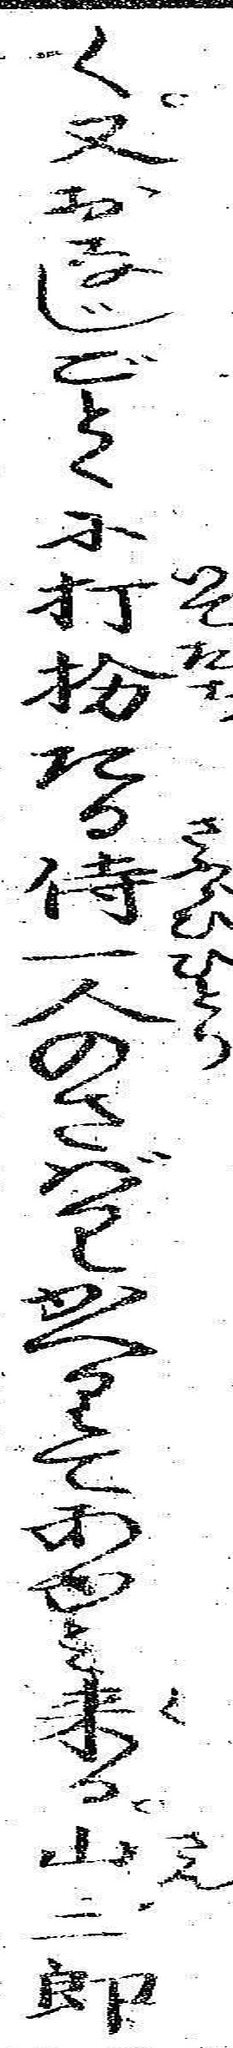く。又おなじごとくに打扮たる侍一人のさばりかへりてあゆみ来る。山三郎
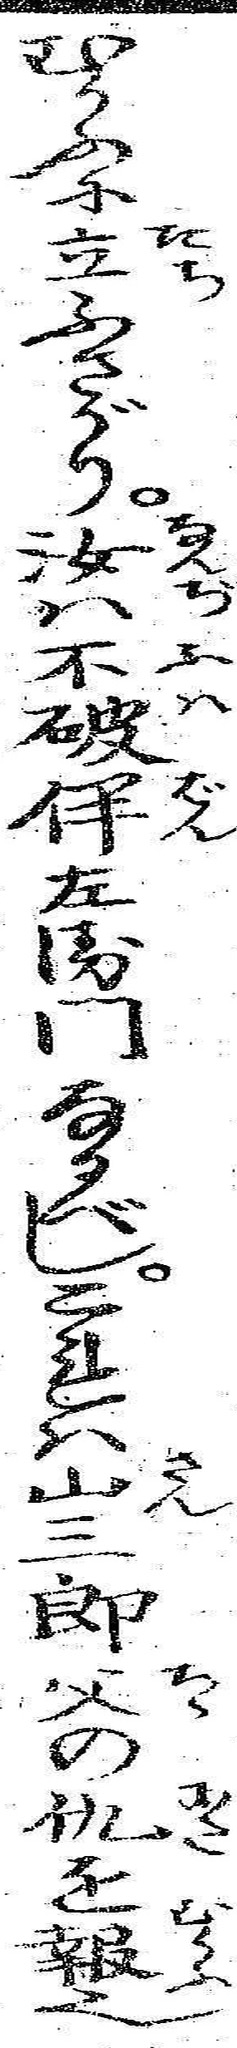むかふに立ふさがり。汝は不破伴左衛門なるべし。これは山三郎父の仇を報也
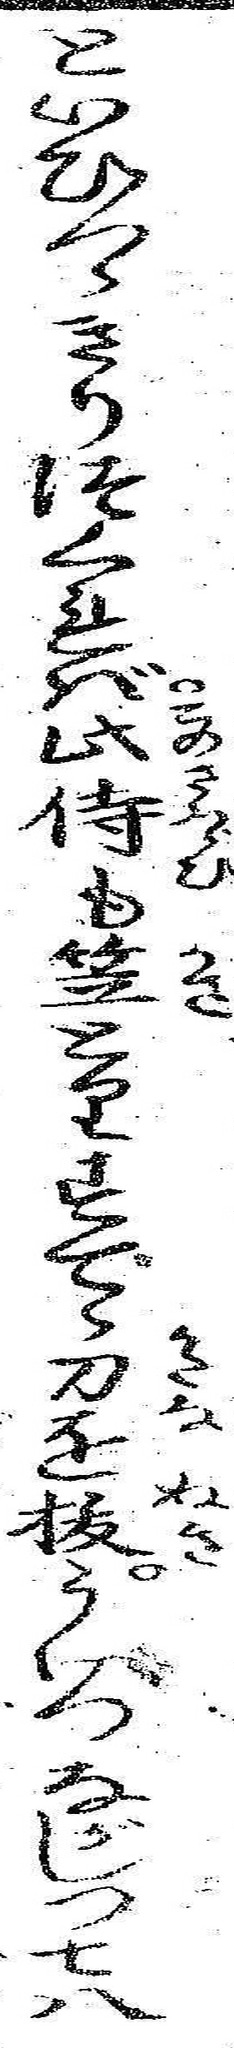といひつゝきりつくれば。此侍も笠とりすてゝ刀を抜。うけつながしつ七八
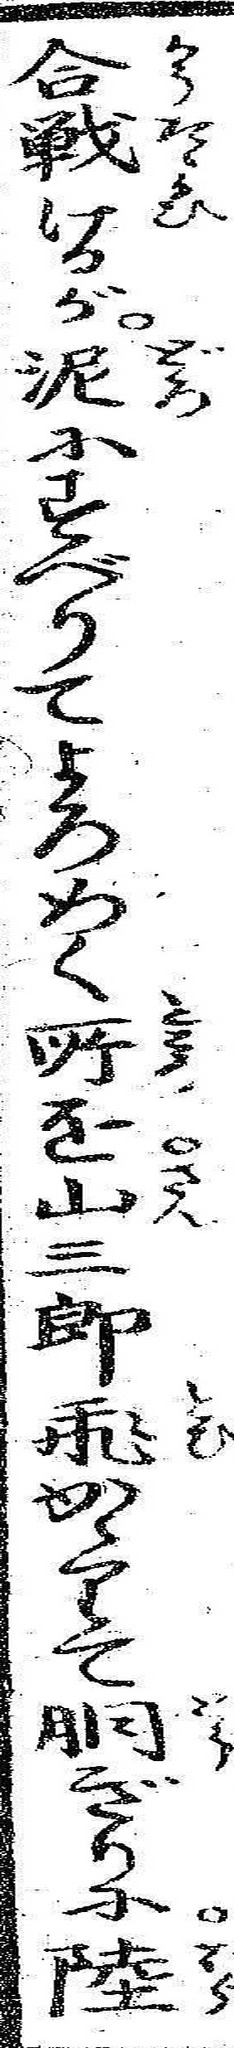合戦けるが。泥にすべりてよろめく所を。山三郎飛かゝりて胴ぎりに。陸
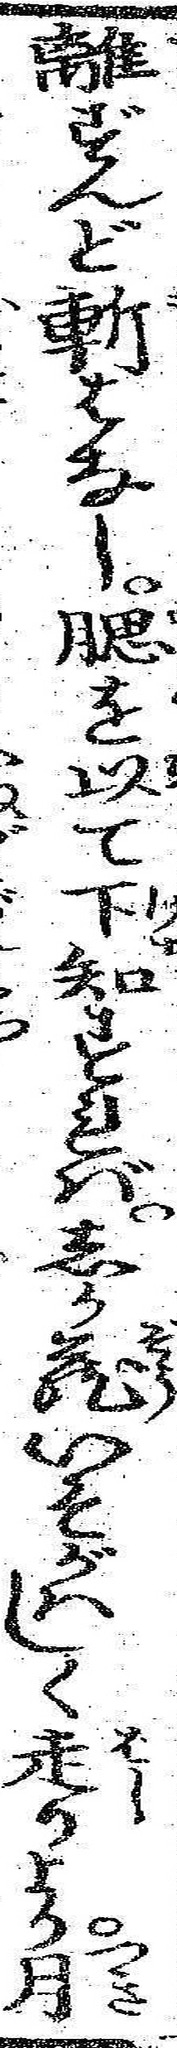離ずんど斬はなし。腮を以て下知すれば。しか蔵いそがはくし走りより。月
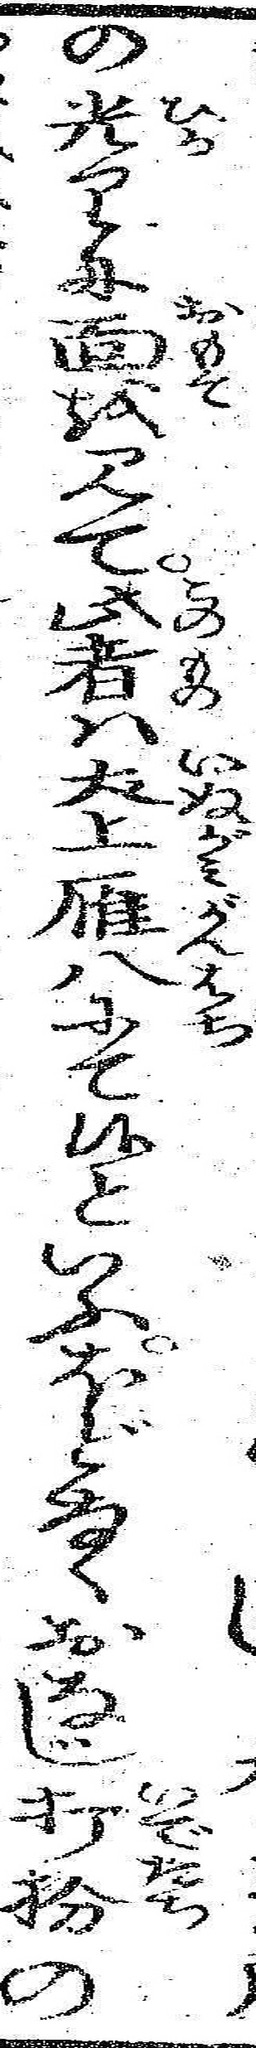の光りに面を見て。此者は犬上雁八にて候といふ。ほどなくおなじ打扮の
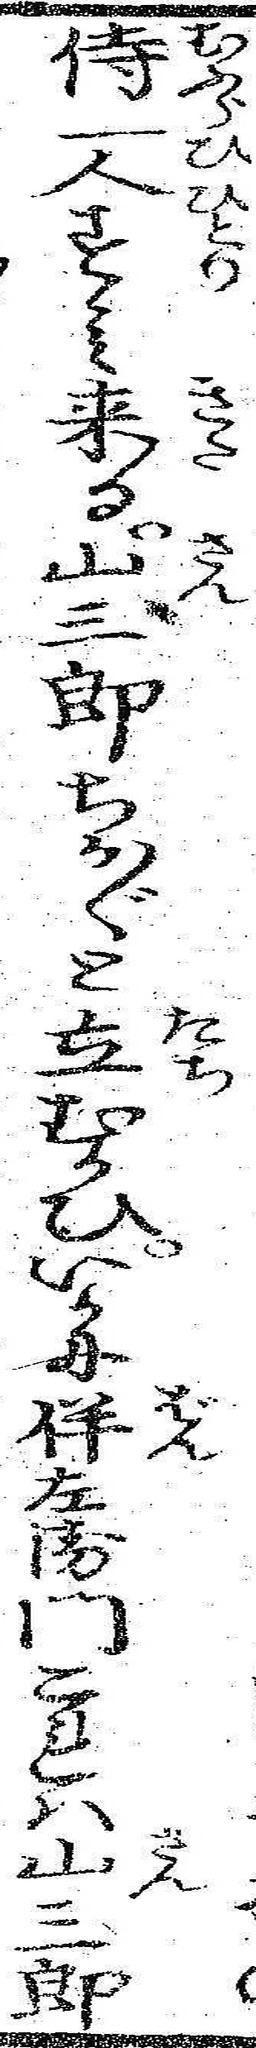侍一人すゝみ来る。山三郎ちか〴〵と立むかひ。いかに伴左衛門これは山三郎
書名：昔話稲妻表紙
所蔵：国文学研究資料館
